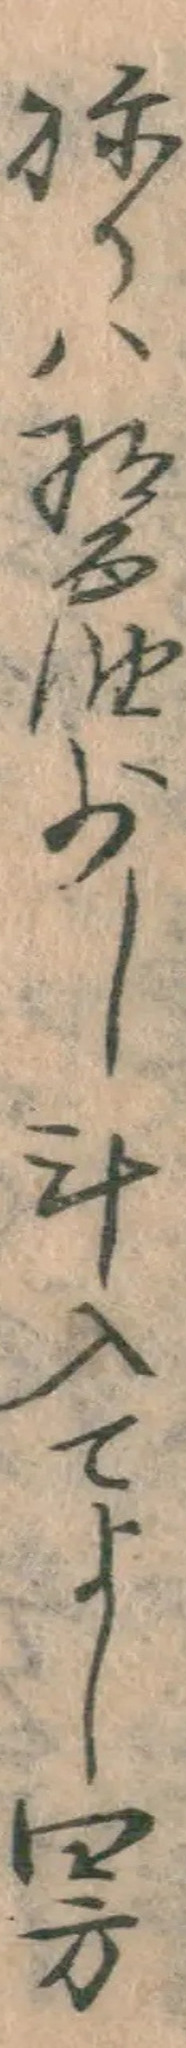ねりは醤油少し斗入てよし四方
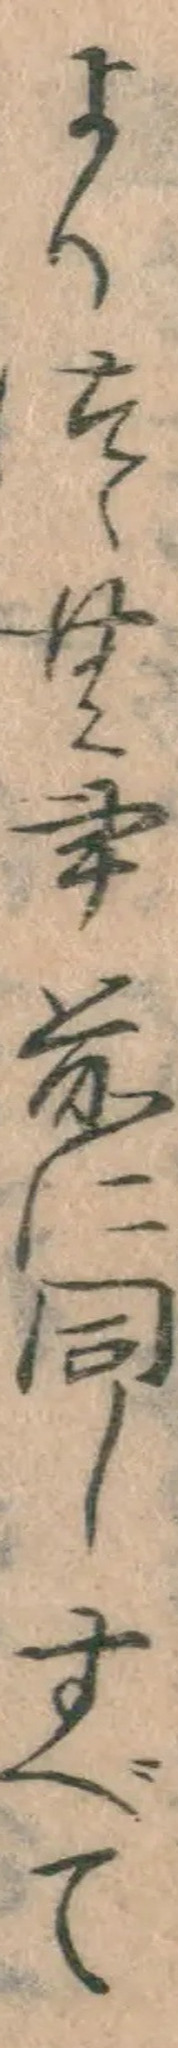よりつゝむ事前に同しすべて
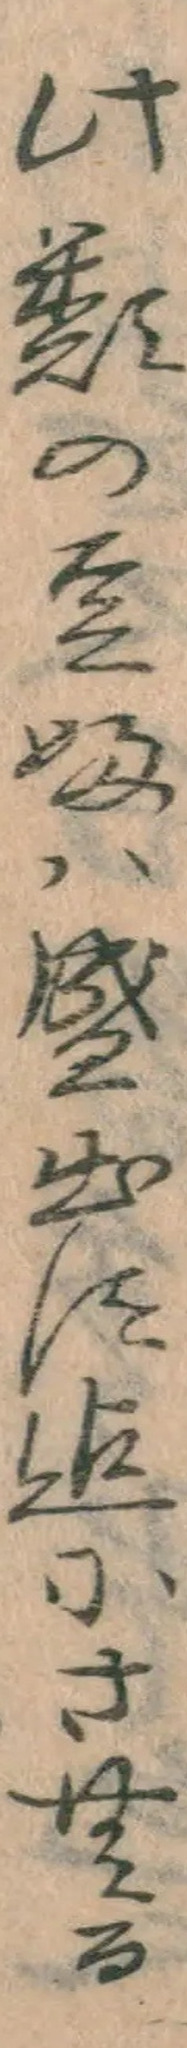此類の豆ふは盛出す迄にさむる
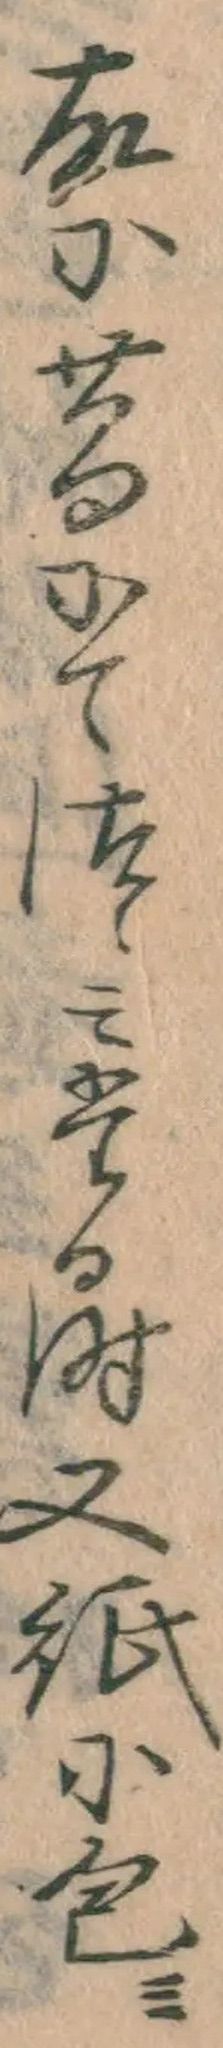故に葛にてつゝみたる時又紙小包み
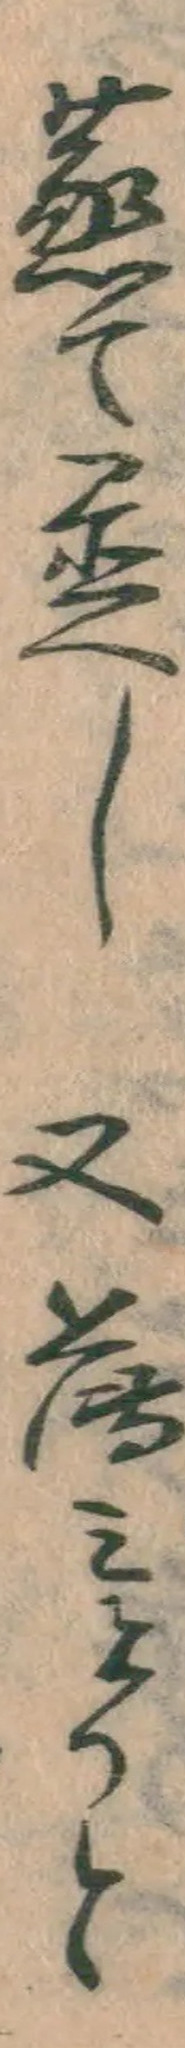蒸て置へし又薄みとりと
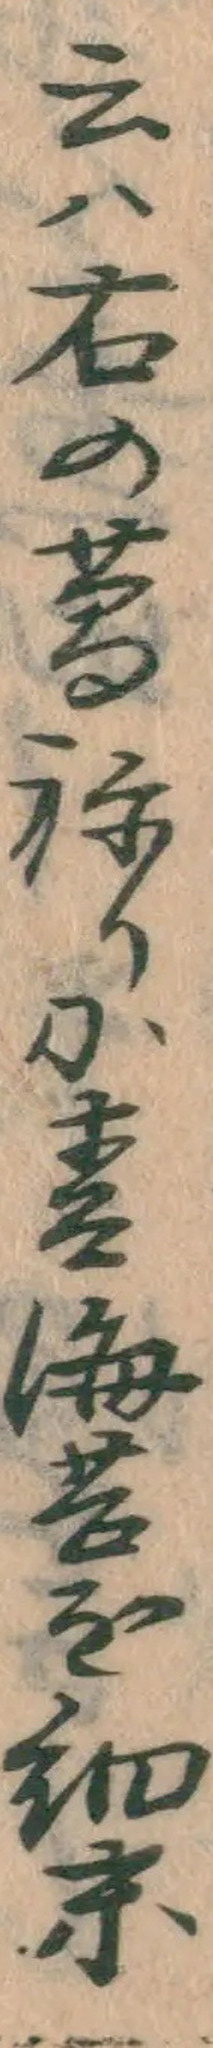云は右の葛ねりに青海苔を細末
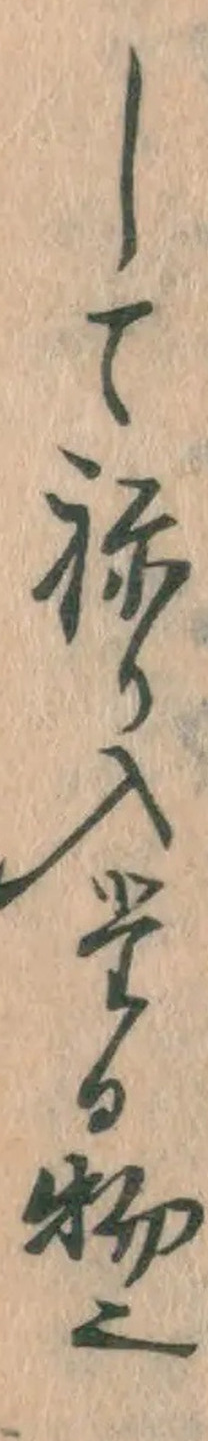してねり入たる物也
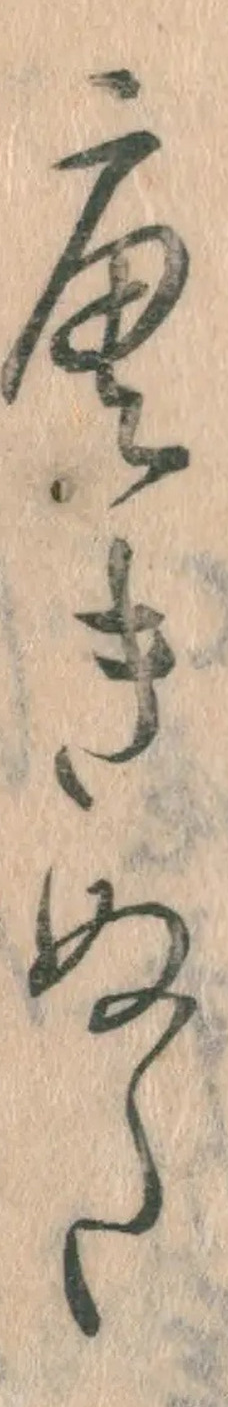唐きぬた
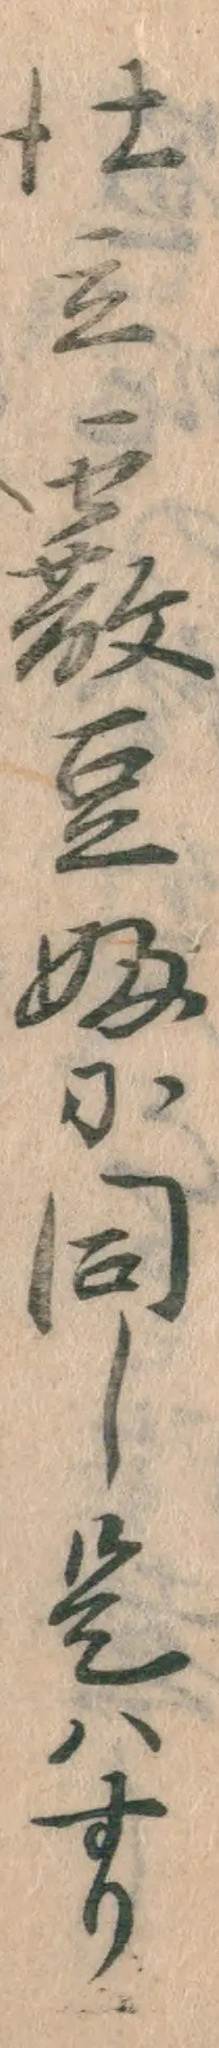仕立霰豆ふに同し是はすり
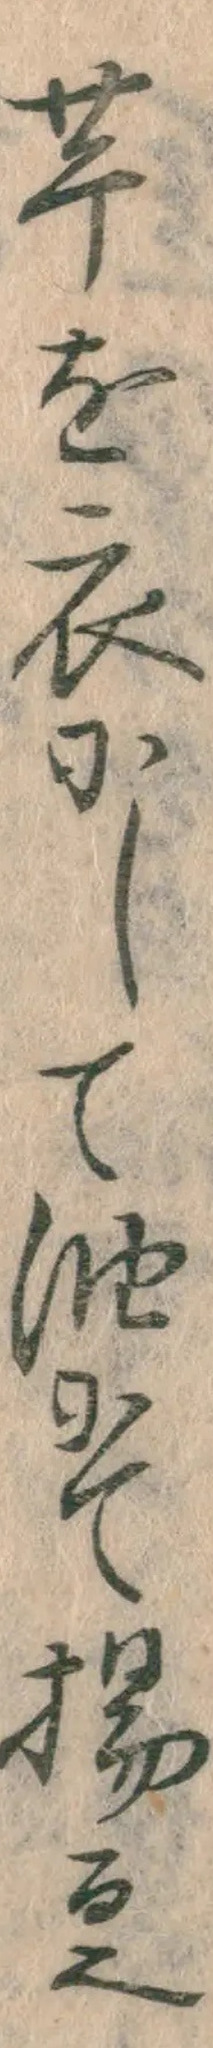芋を衣にして油にて揚る也
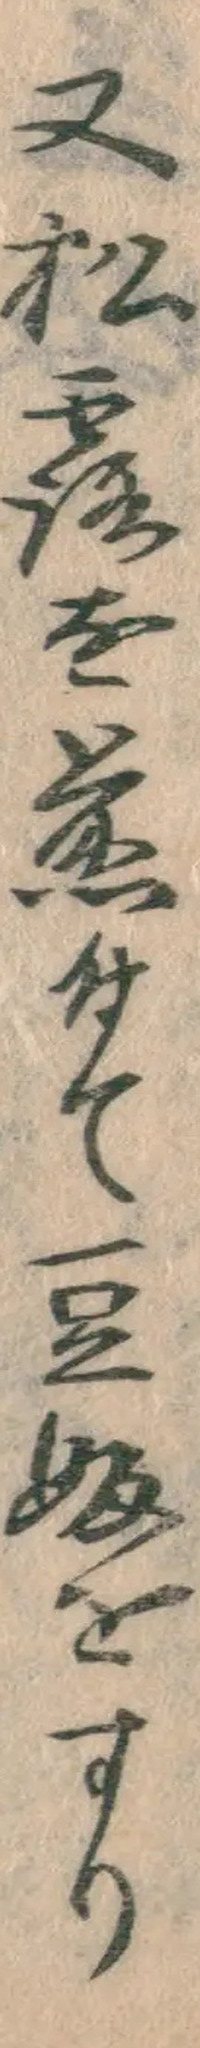又松露を煎付て豆ふをすり
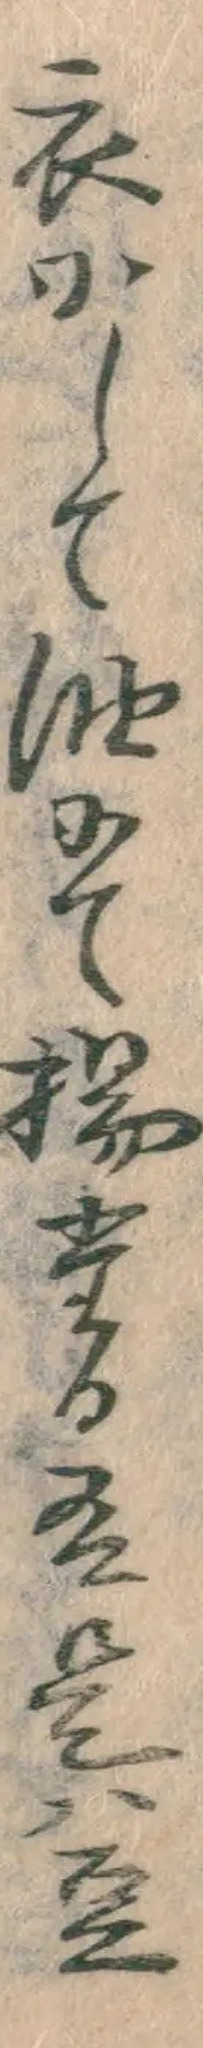衣にして油にて揚たる有是は豆
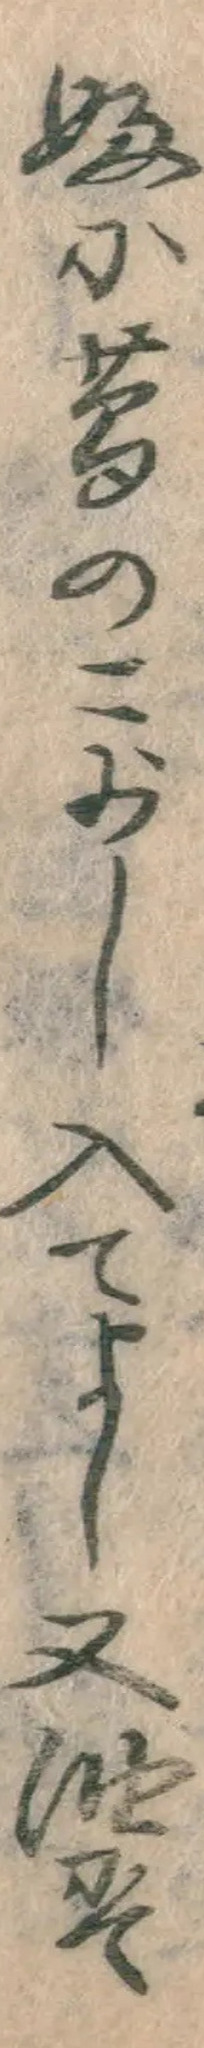ふに葛のこ少し入てよし又油にて
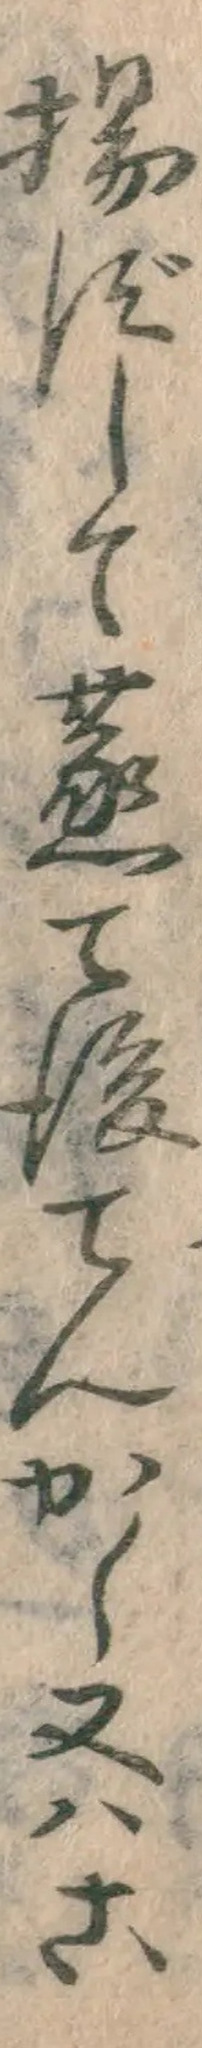揚ずして蒸て後てんかく又はこ
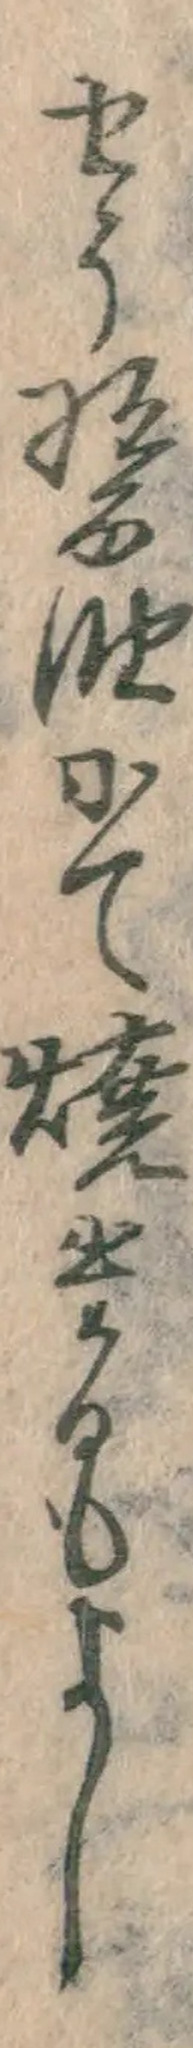せう醤油にて焼たるもよし
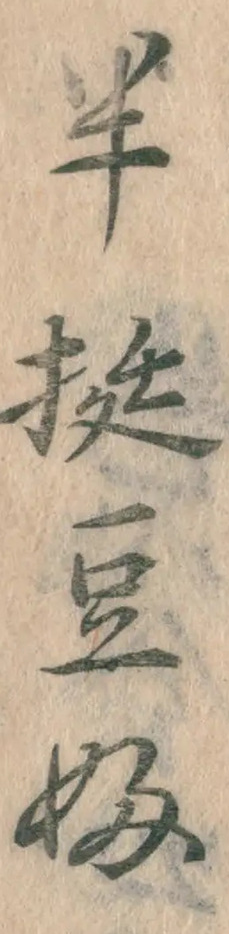半挺豆ふ
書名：豆腐百珍余録
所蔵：国立国会図書館 National Diet Library, JAPAN
